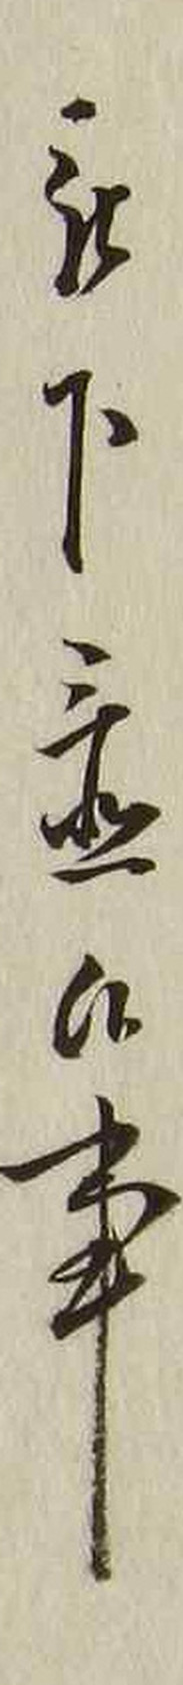被下置候事
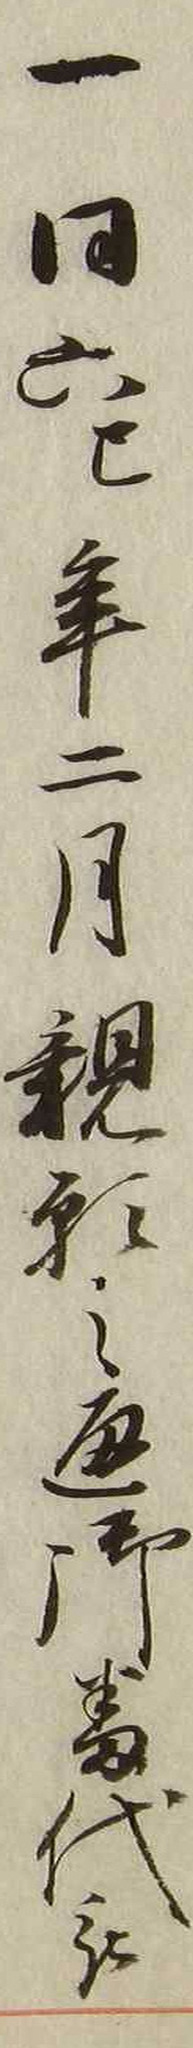一同六巳年二月親願之通御番代被
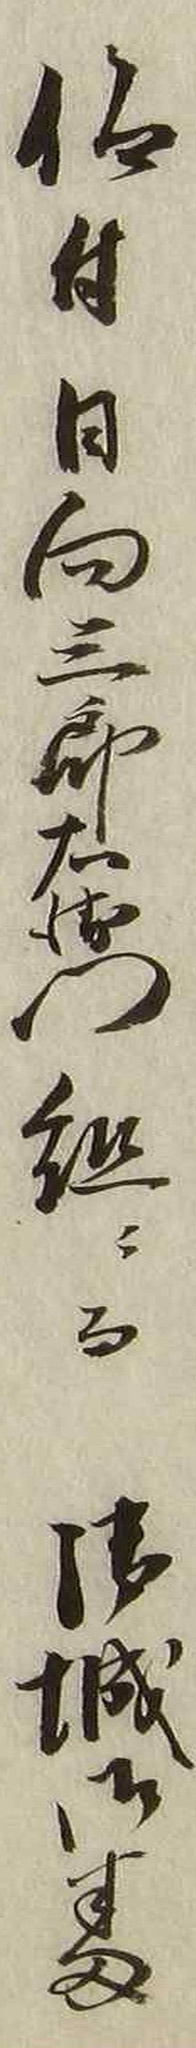仰付日向三郎右衛門組ニ而御城御番
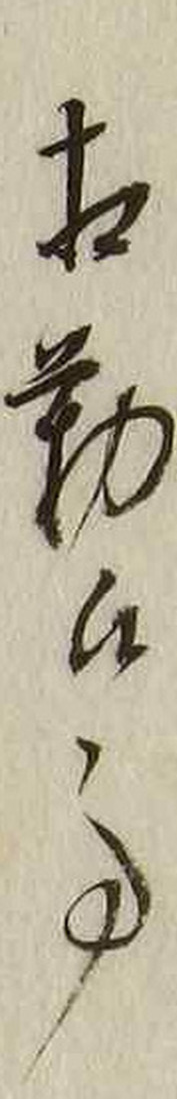相勤候事
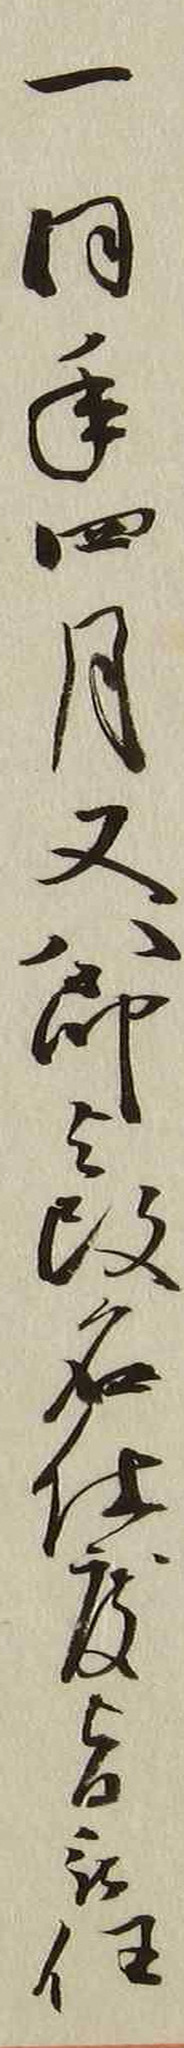一同年四月又八郎与改名仕度旨被任
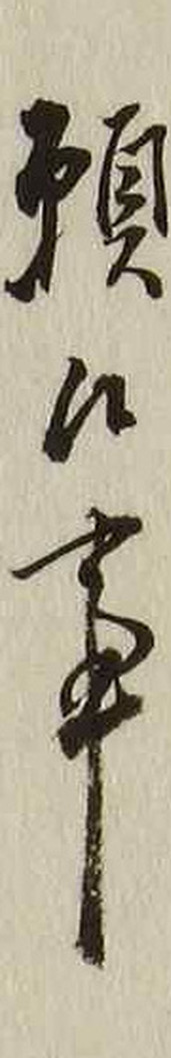願候事
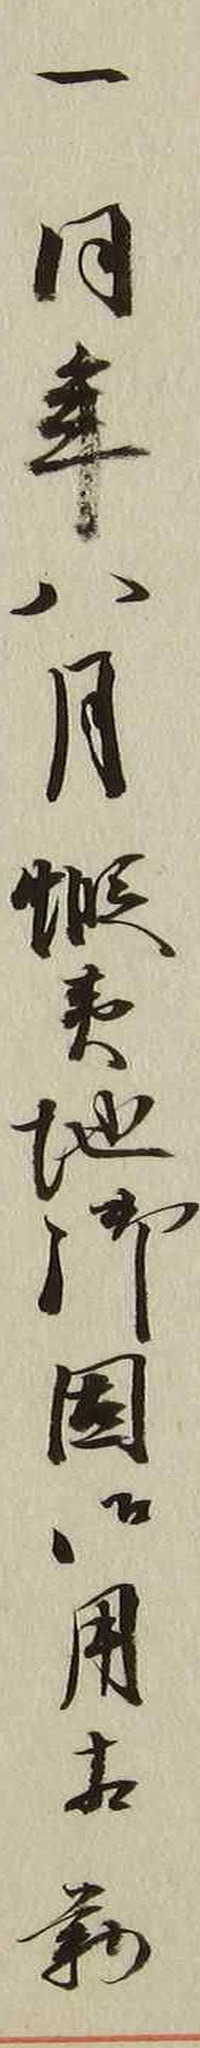一同年八月蝦夷地御固御用相勤
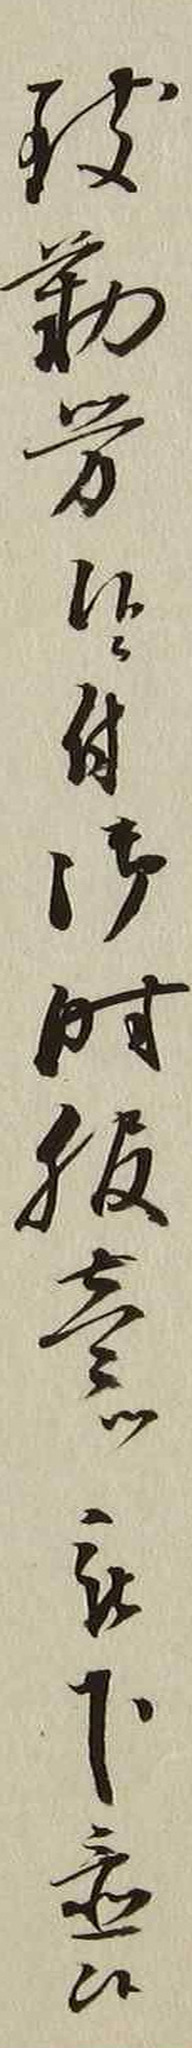致勤労候ニ付御時服壱ツ被下置候
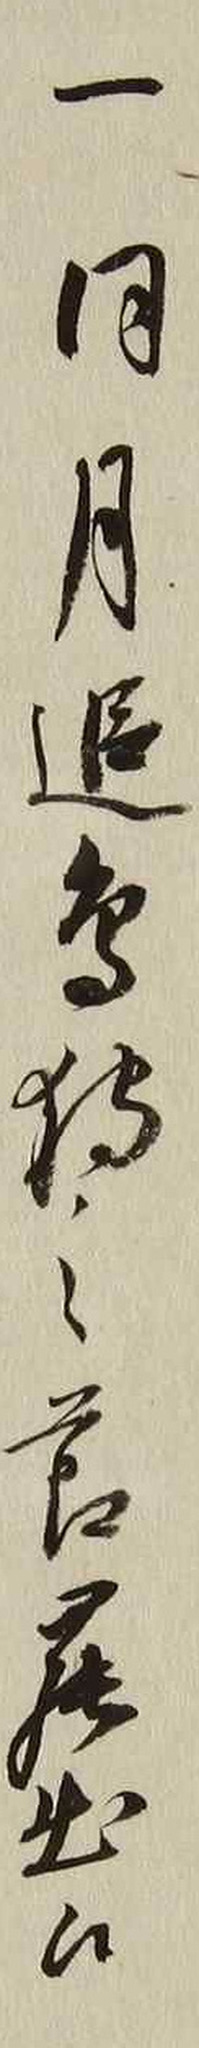一同月追鳥狩之節罷出候
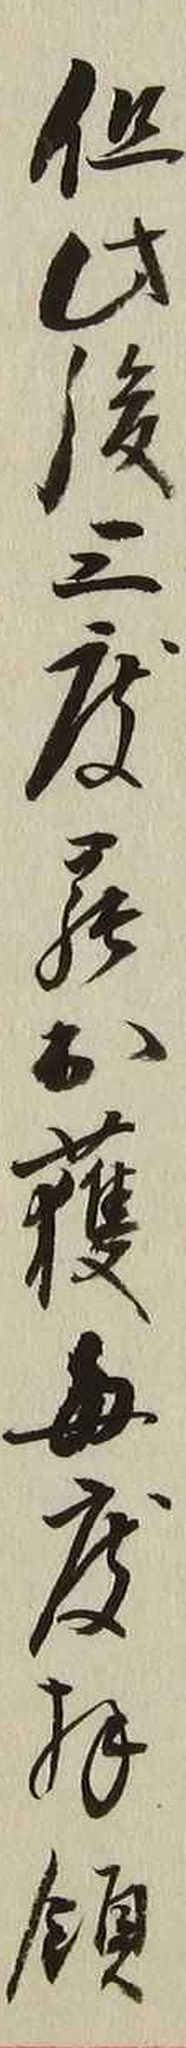但此後三度罷出獲毎度拝領
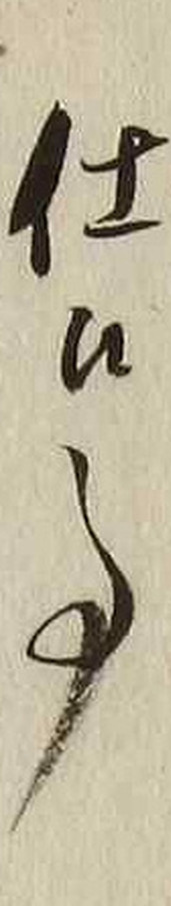仕候事
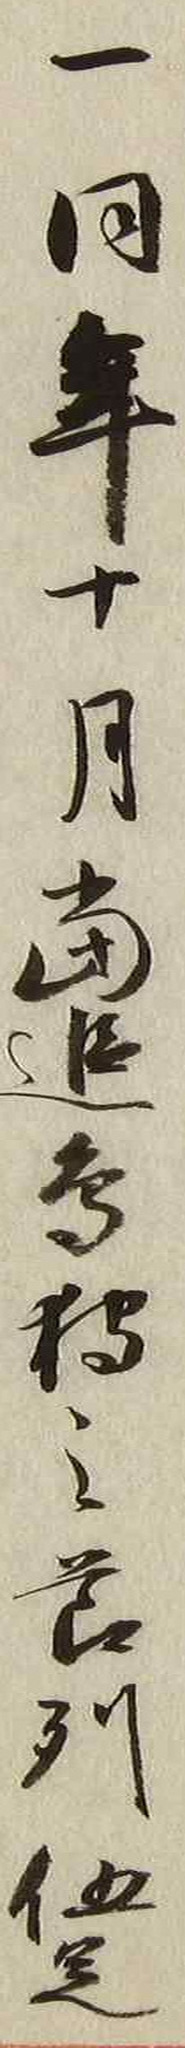一同年十月当追鳥狩之節列伍足
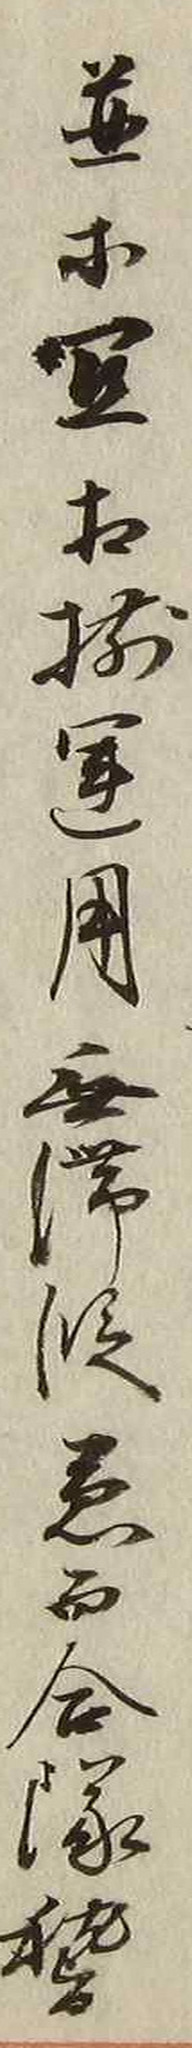並等宜相揃運用無滞段兼而合塚稽
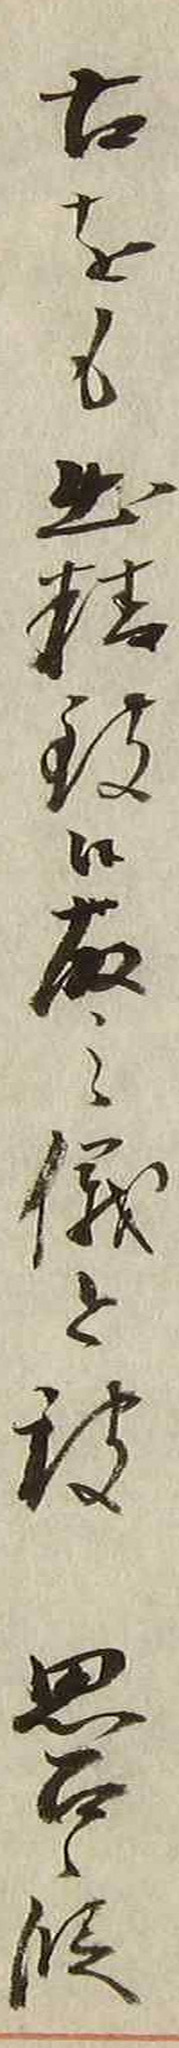古をも出精致候故之儀と被思召候段
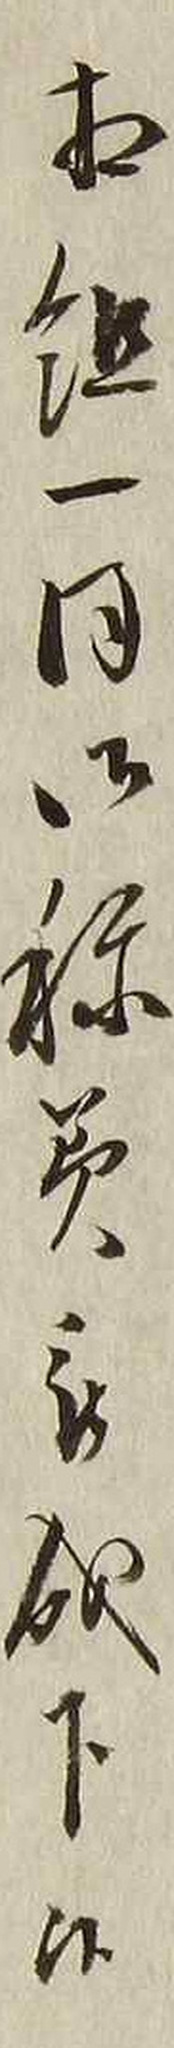相組一同御称美被成下候
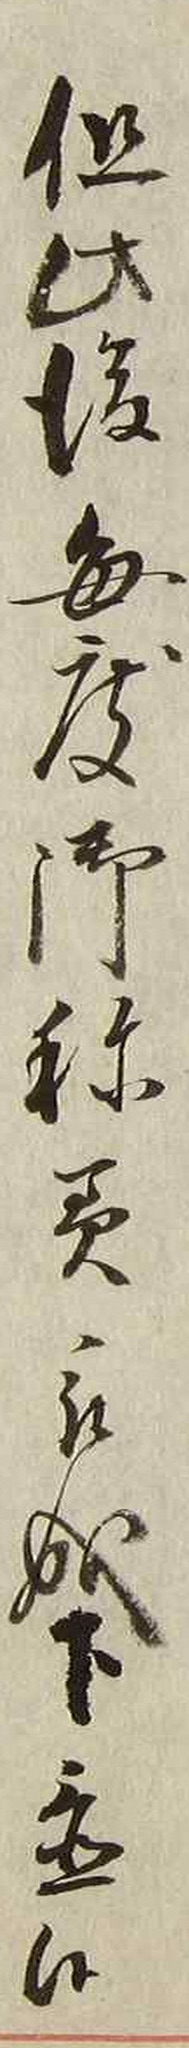但此後毎度御称美被成下置候
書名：諸士系譜　巻之22　い之部22
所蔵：会津若松市立会津図書館
